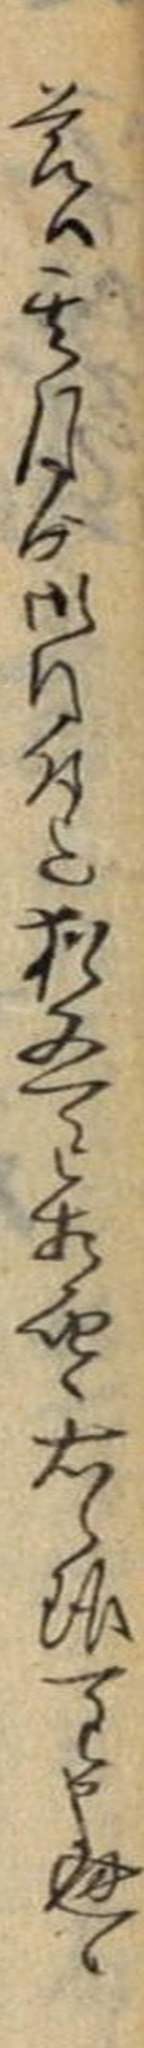節は其月ゟ御目付迄猶又可被相届候右之趣可被申通候
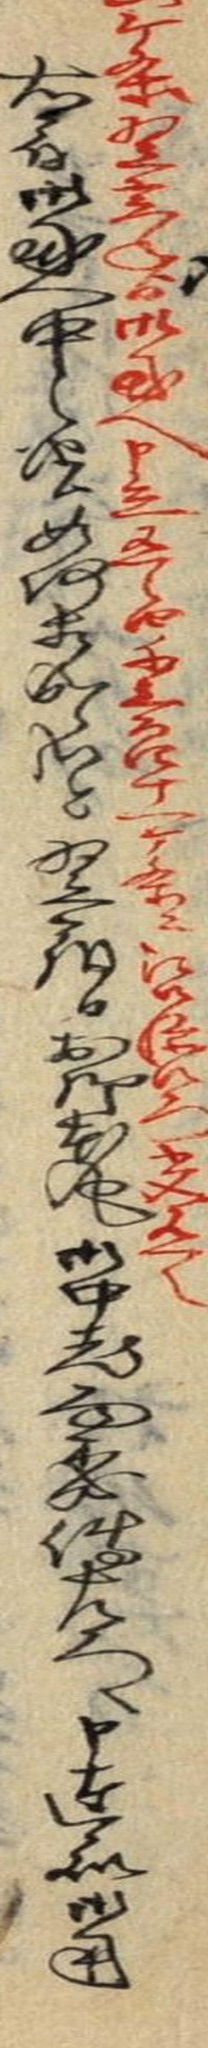右に付御用人中之儀は如何相成候哉と翌朔日於御本丸御中老雨森伝左衛門へ申達候処御用
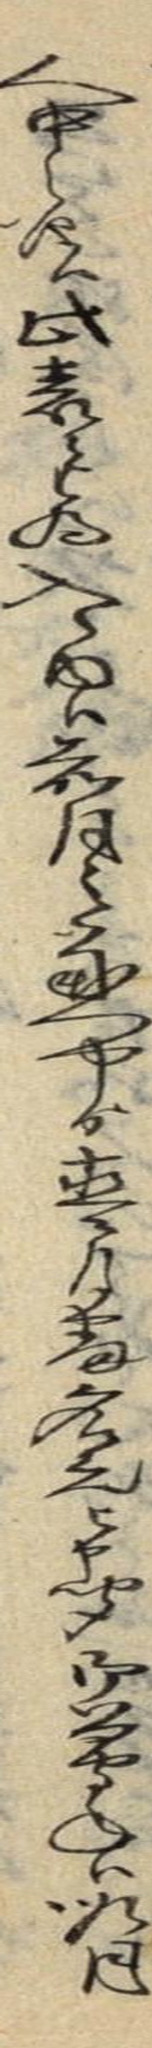人中之儀は此表に被為入候内は前月之御用人中ゟ直々月番名元被申聞御留守年は順月
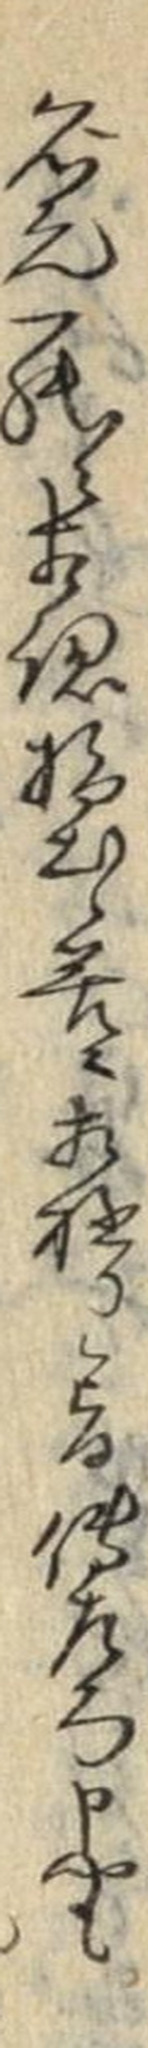名元一紙に相認指出候筈に相極り候旨伝左衛門申聞候
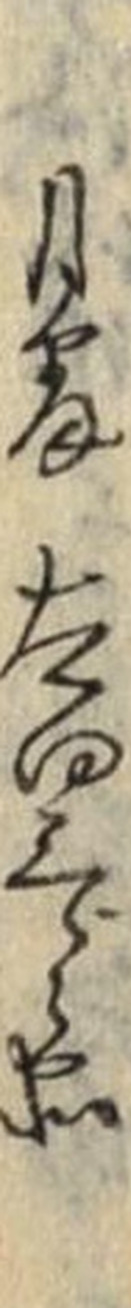月番太田三郎兵衛
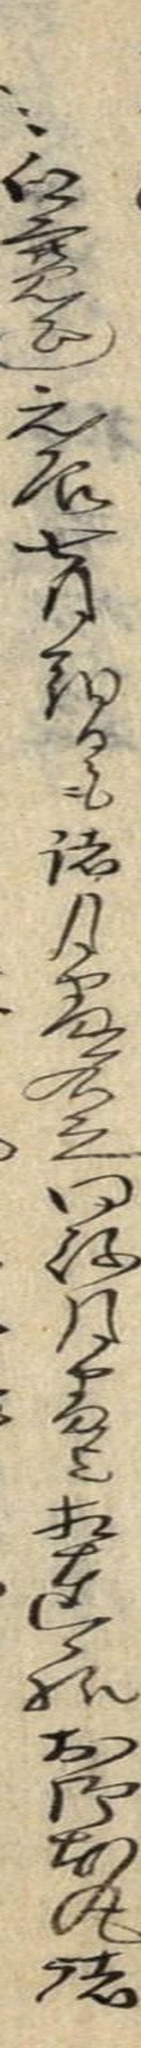但寛延元辰七月朔日にも諸月番名元同役月番迄相達候様於御本丸諸
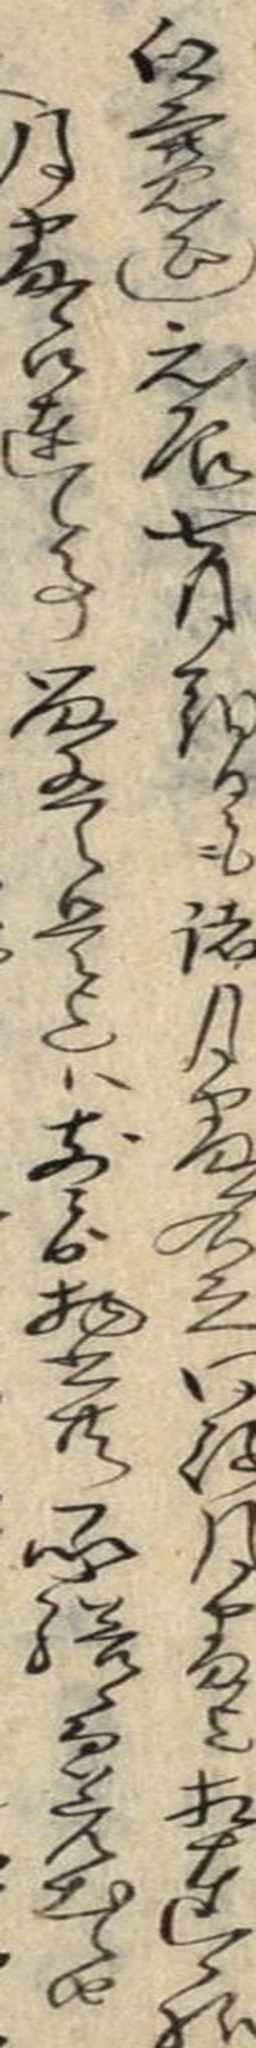月番へ口達之事留有之是迄は前々ゟ物書共へ承繕に而差出候由
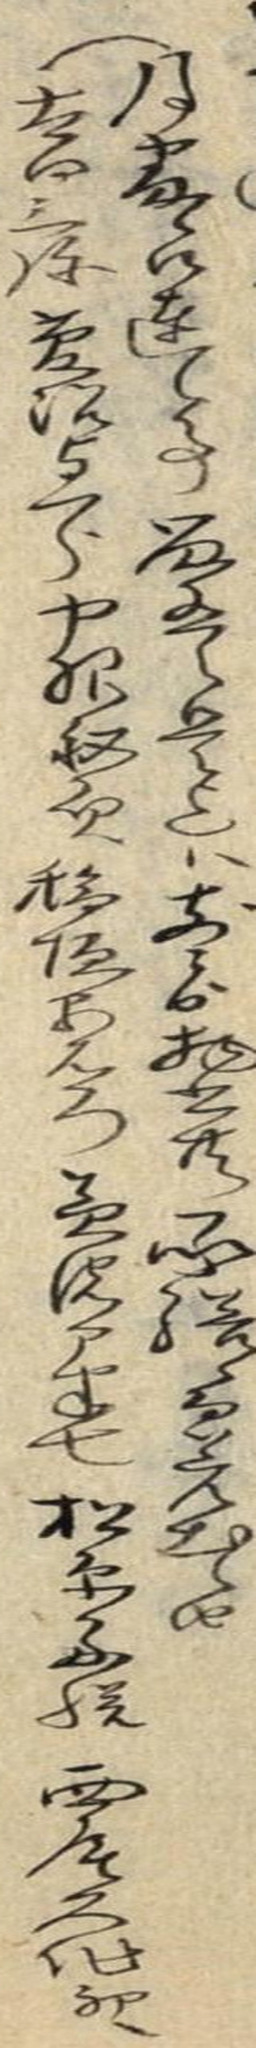太田三弥菅沼与一郎中根靭負稲垣安右衛門美濃部半七松原多膳西尾久作初へ
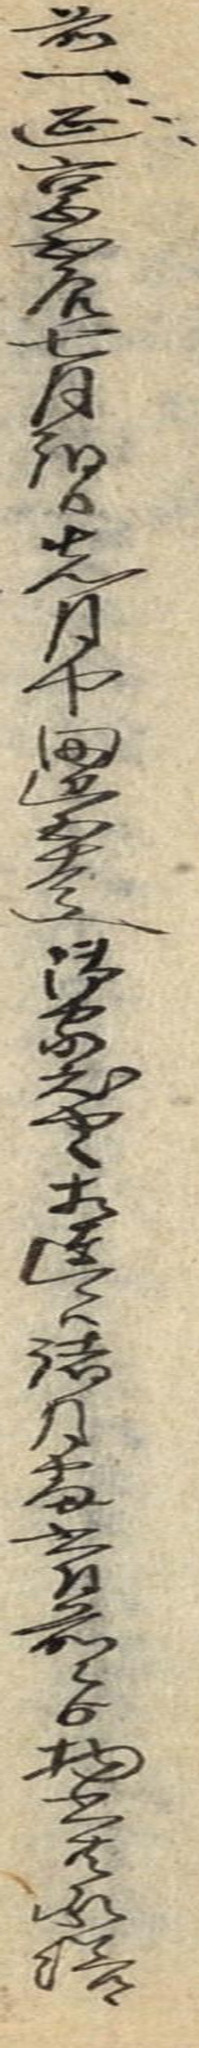前一延享五辰七月朔日先月中田辺五太夫御家老中へ相達候は諸月番書付前々ゟ物書共承繕候
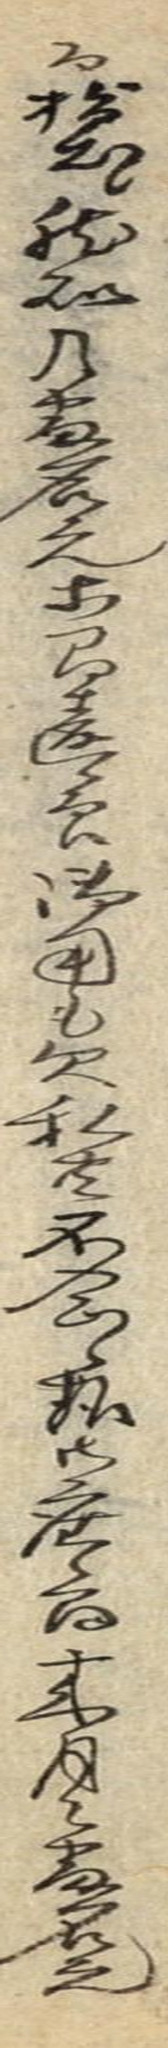而指出候然処月番名元等間違候而は御用も欠私共不念候趣御座候間来月々番名元
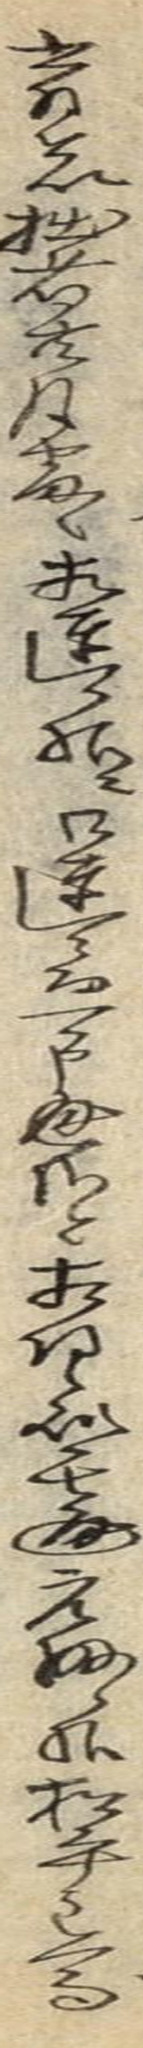書付を以拙者共月番へ相達候様に口達に而可申通候哉と相伺候処其通取扱候様松平主馬
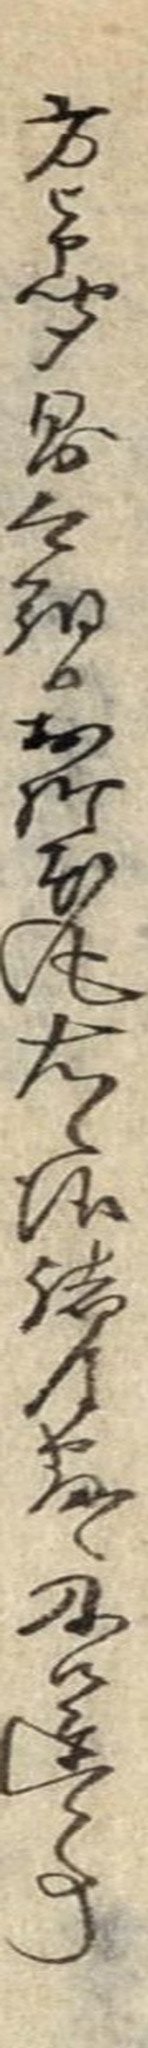方被申聞則今朔日於御本丸右之趣諸月番へ及口達候事
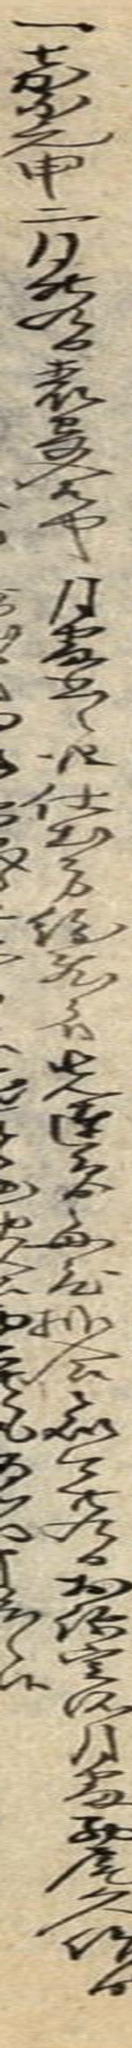一嘉永元申二月廿九日表寄合中月番書之儀仕出方紛敷候付先達而ゟ毎度掛合候処今廿九日於評定所月番西尾久作ゟ
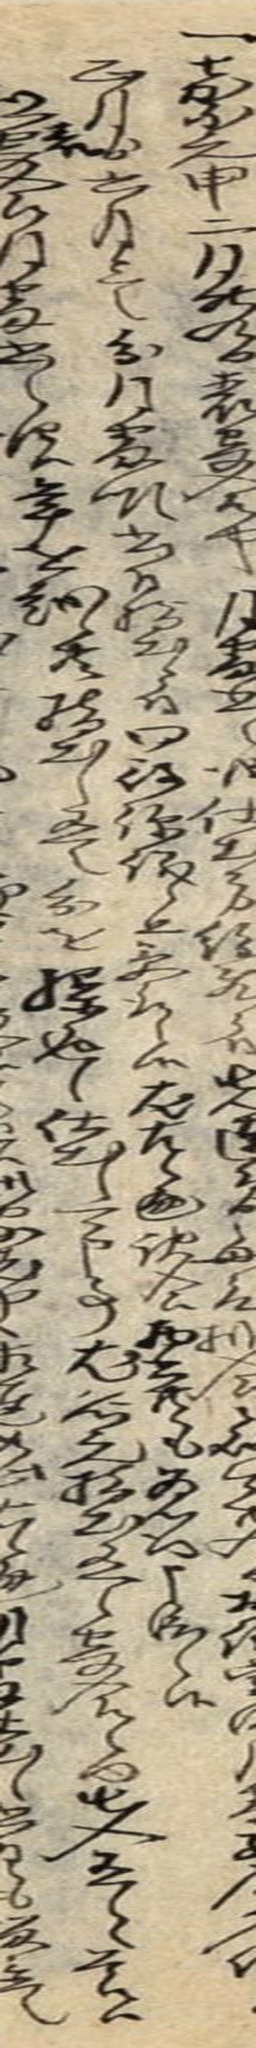但表寄合月番書之儀は年を越候共指出し有之分を繰返し仕出し可申候事尤名元指出有之寄合之内出入有之候節は
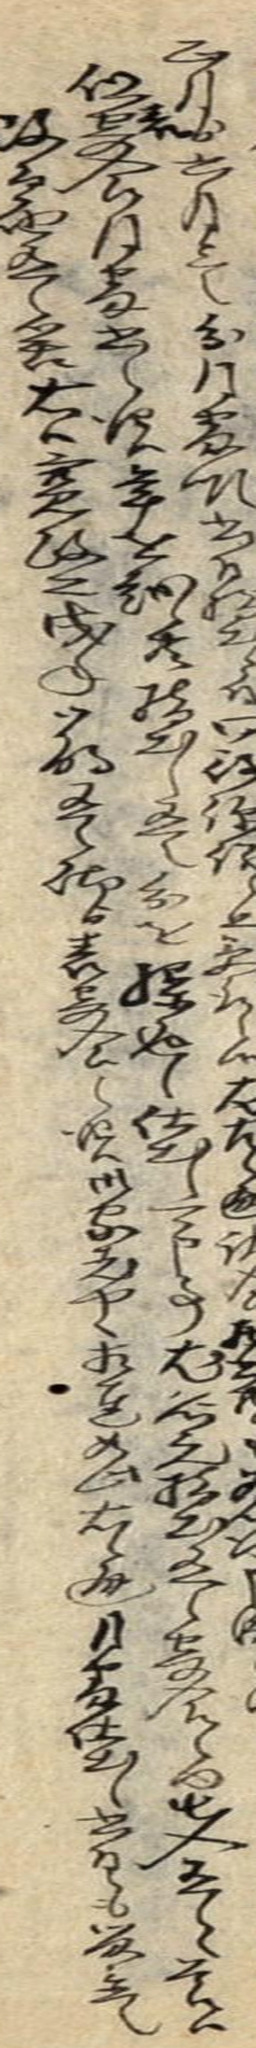改而届有之筈右は寛政二戌年御触有之砌ゟ表寄合之儀は御家老中へ相達如此右之通月番仕出候書付にも留置之

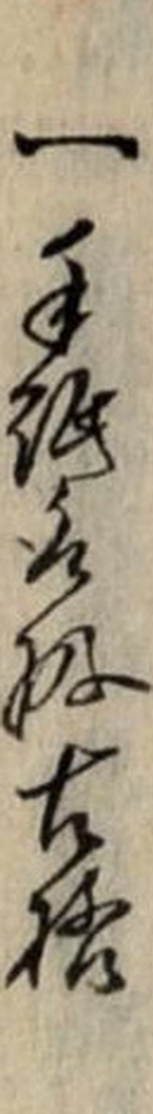一手紙取扱古格
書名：蒐輯之部
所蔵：福井県文書館 Fukui Prefectural Archives
